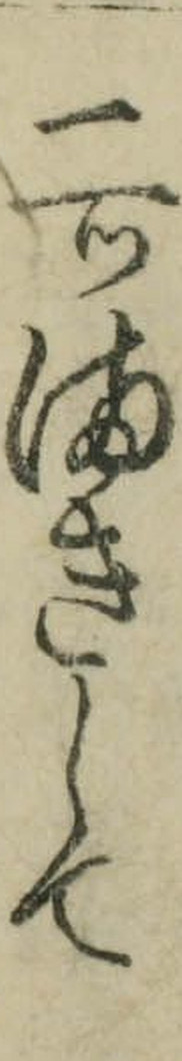二つまきして
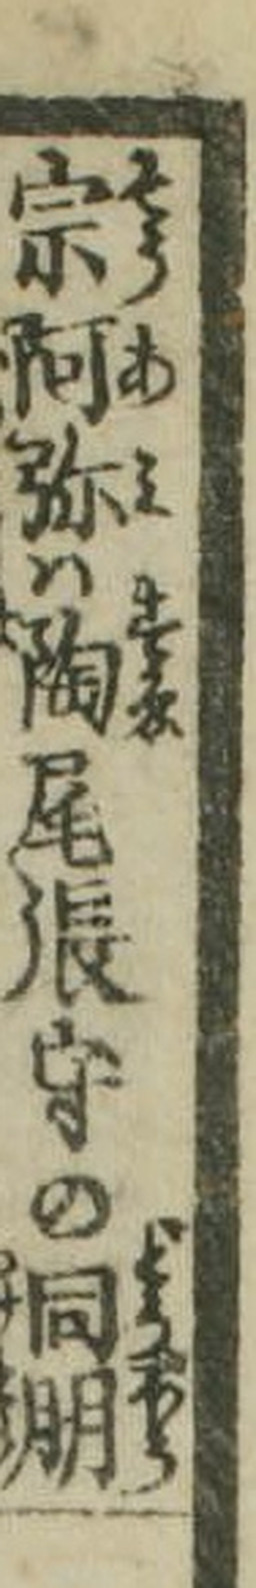宗阿弥は陶尾張守の同朋
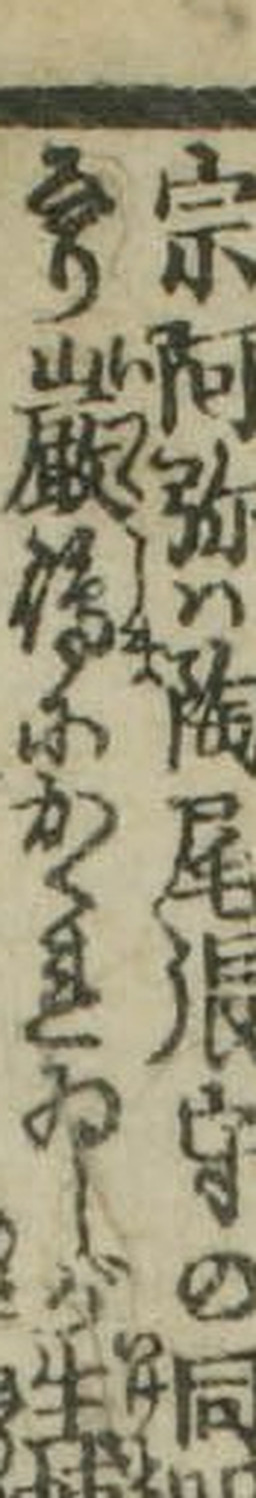なり厳島にかくれゐしが生捕
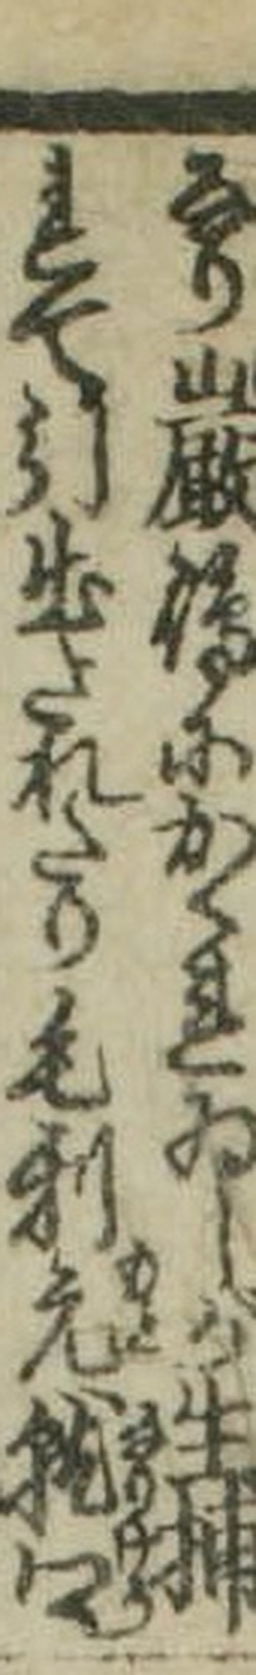れて引出されたり毛利元就卿
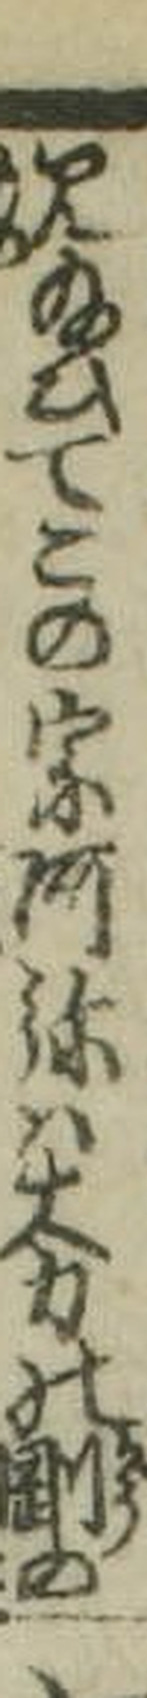見給ひてこの宗阿弥は大力の剛の
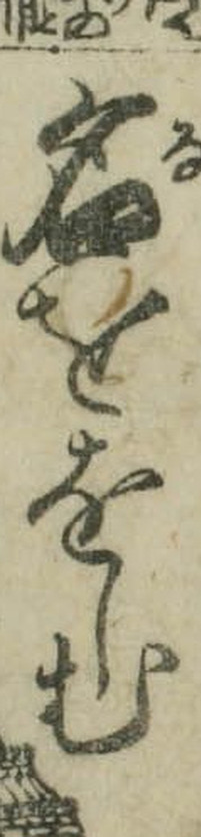名ををしむ
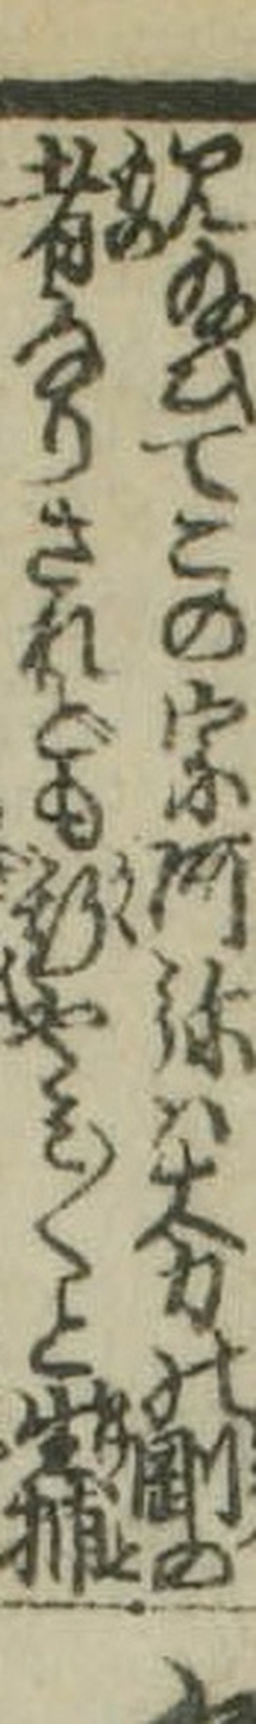者なりされども斯やみやみと生捕
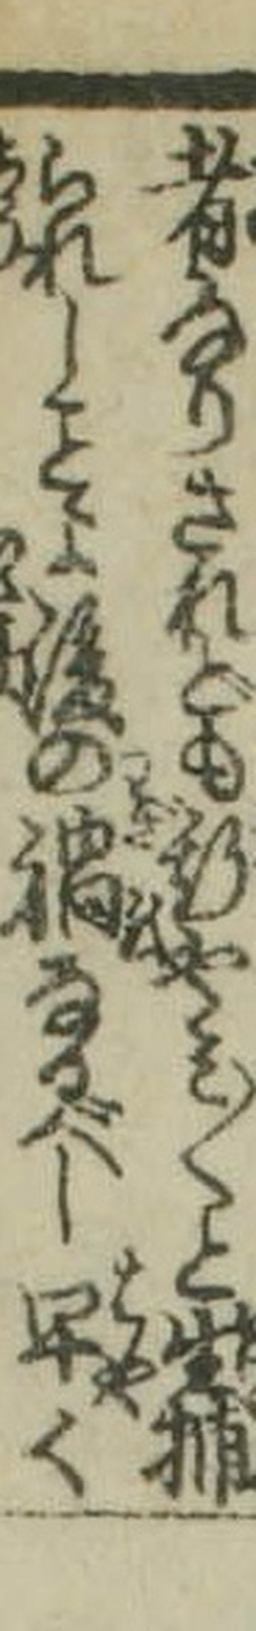られしことよ後の禍なるべし早く
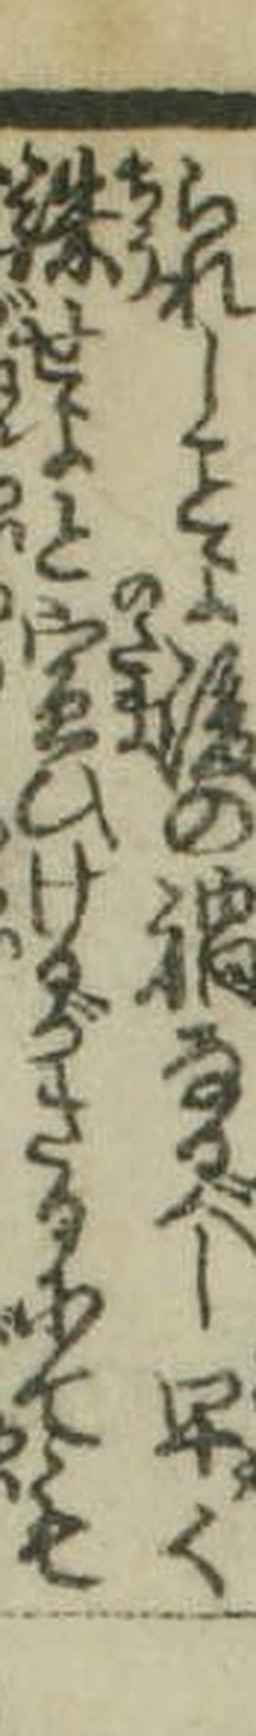誅せよと宣ひけるがさるにても
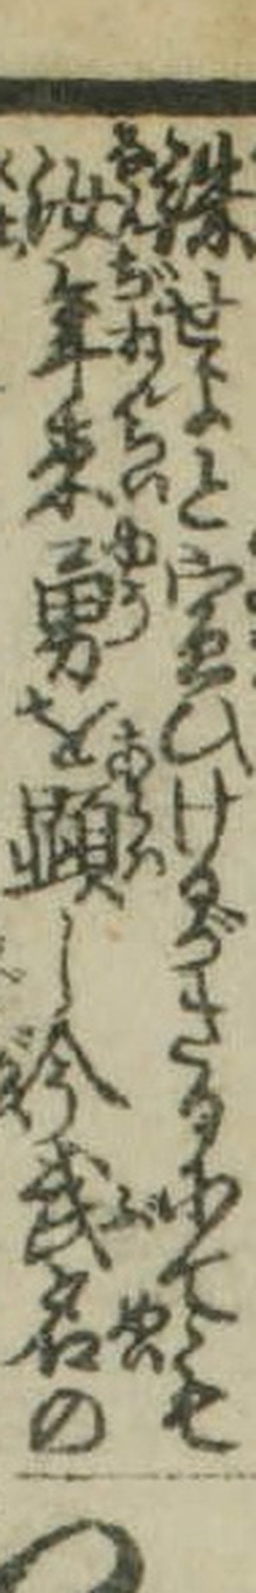汝年来勇を顕しいま武名の
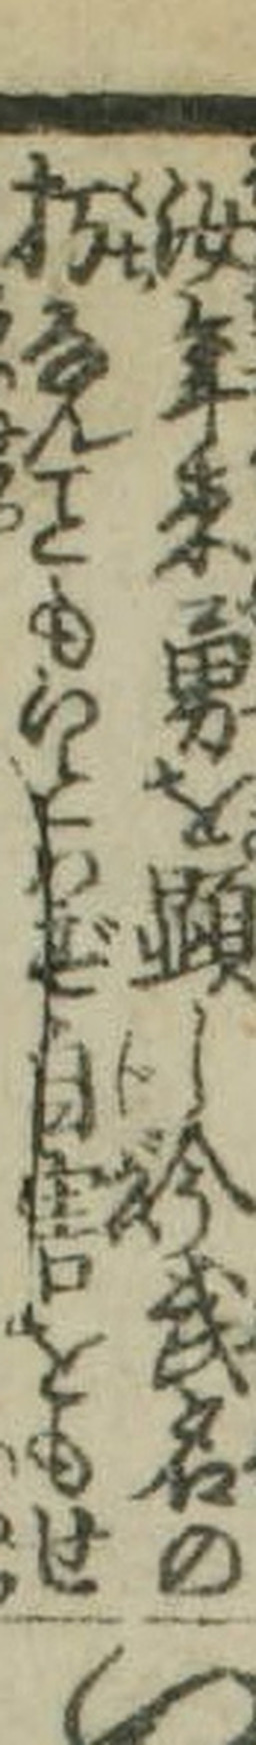朽なんこともいとはず自害をもせ
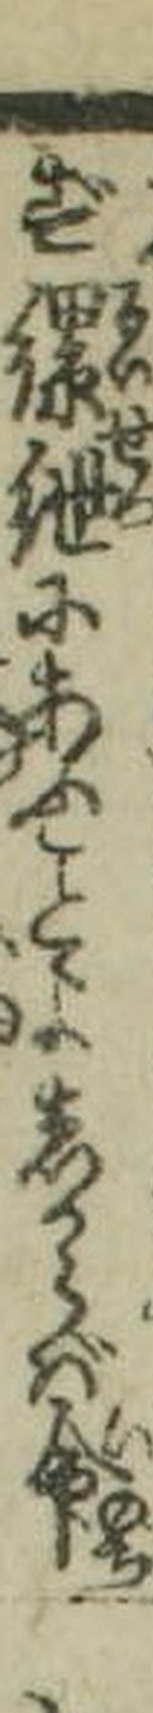ず縲紲にあふことよしからば命
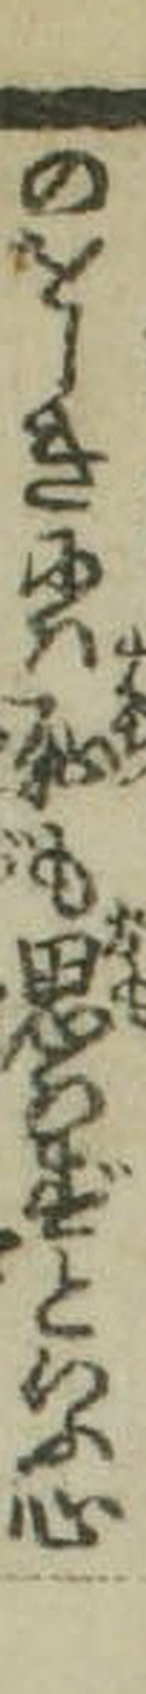のをしきには恥も思はずといふ心
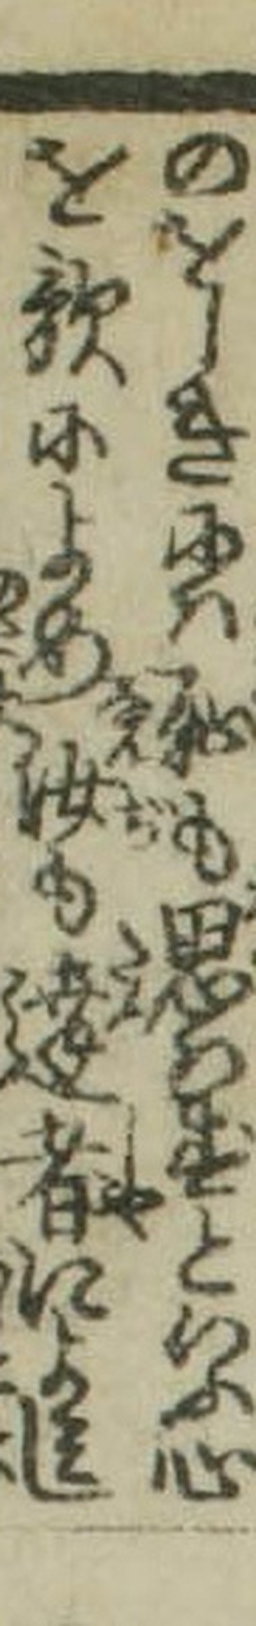を歌によめ汝も達者によみし
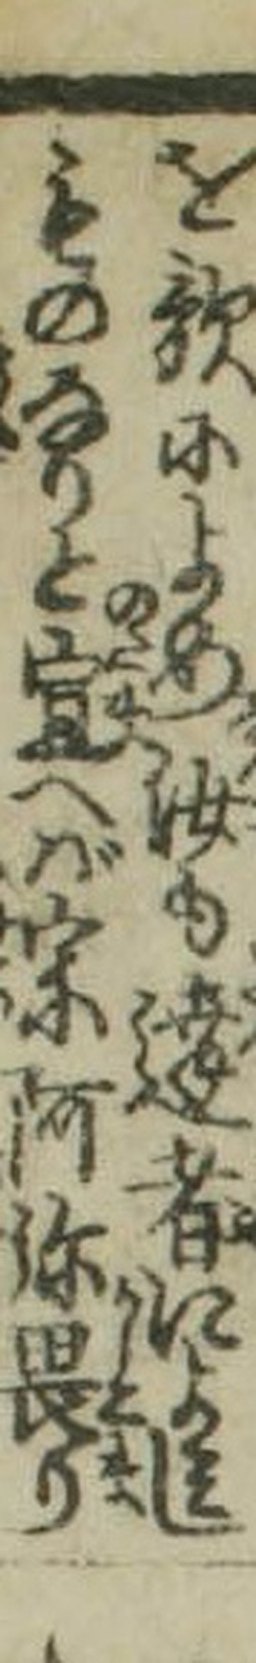ものなりと宣へば宗阿弥畏り
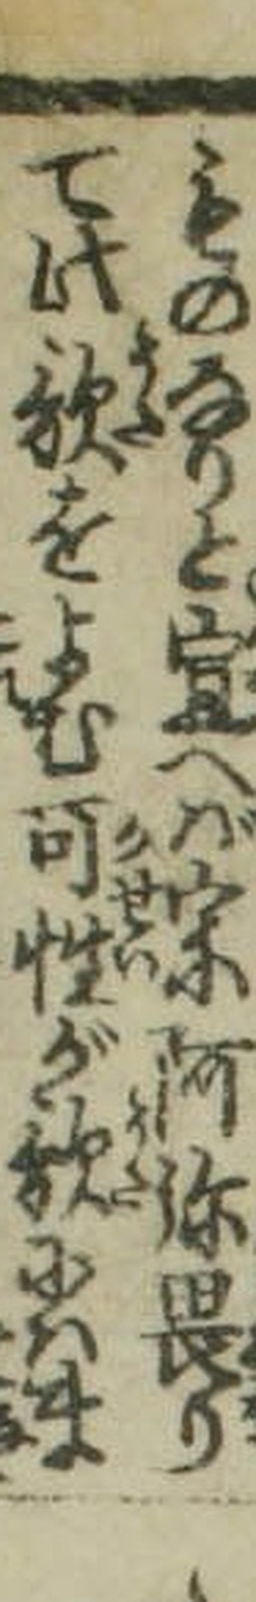て此歌をよむ可性が歌にはま
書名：續英雄百人一首
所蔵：東京学芸大学附属図書館
